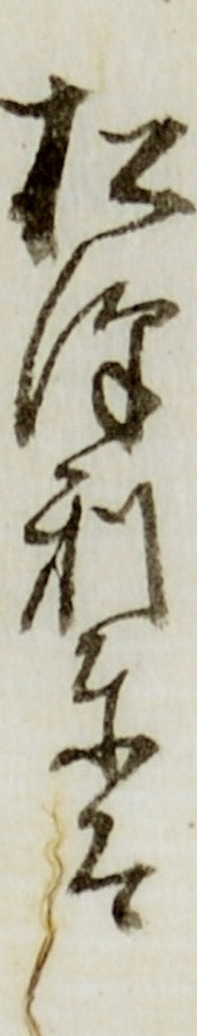松沢利東太
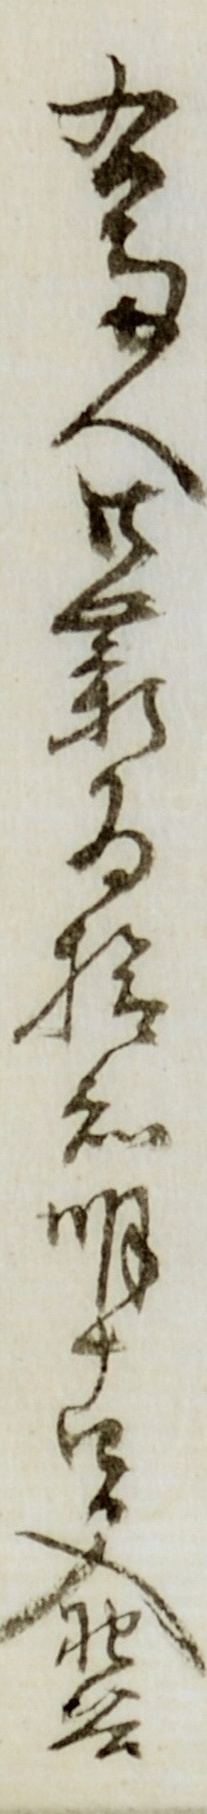右両人御薪為検知明十四日入野谷
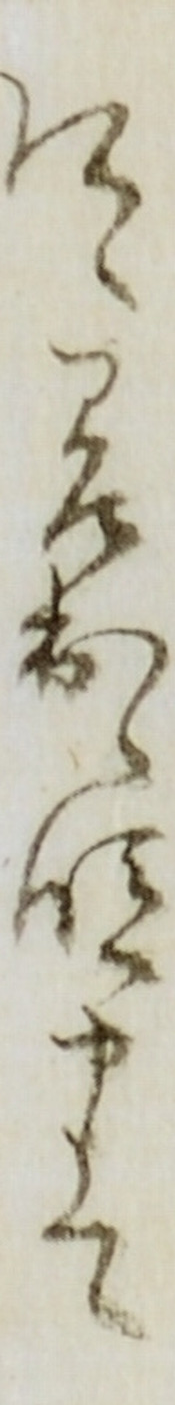郷へ差出候段申上候
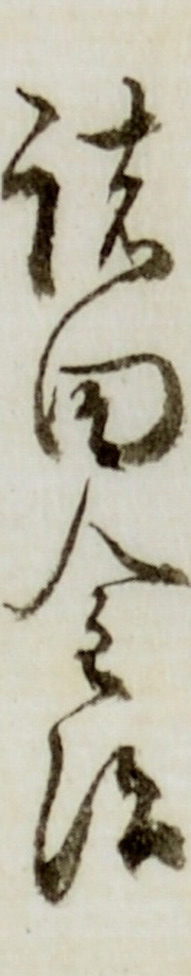諸田金治
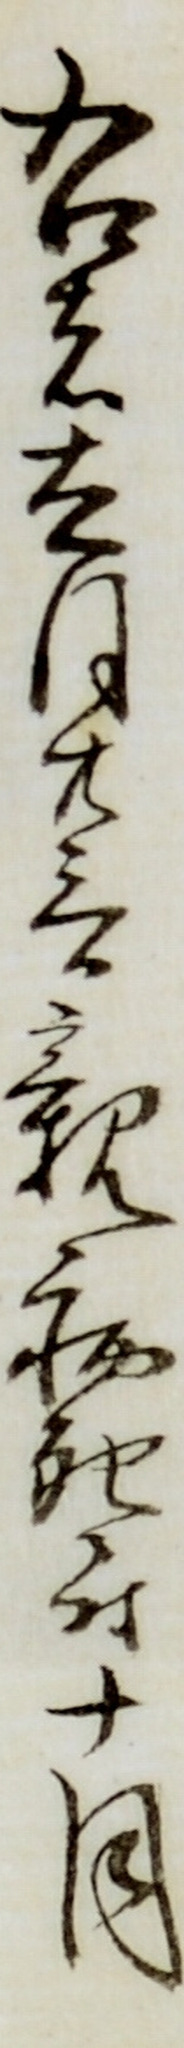右は去月廿三日親病死に付十月
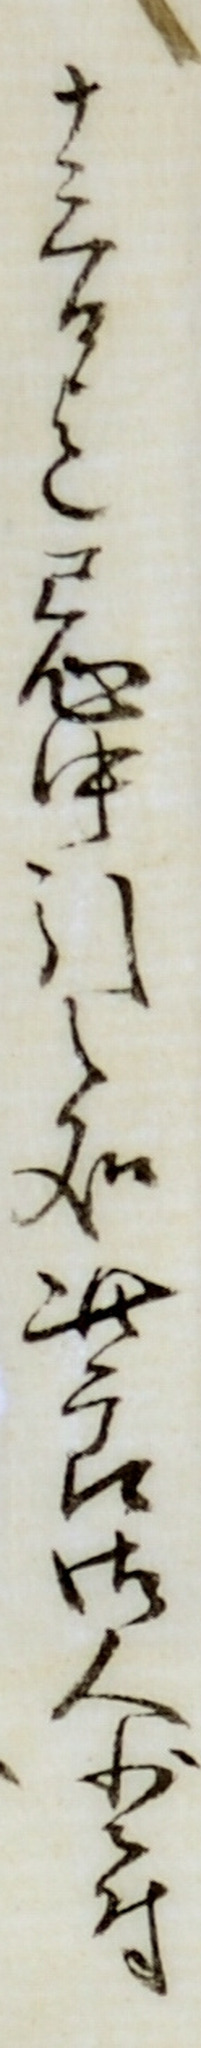十三日迄忌中引之処此節御人少に付
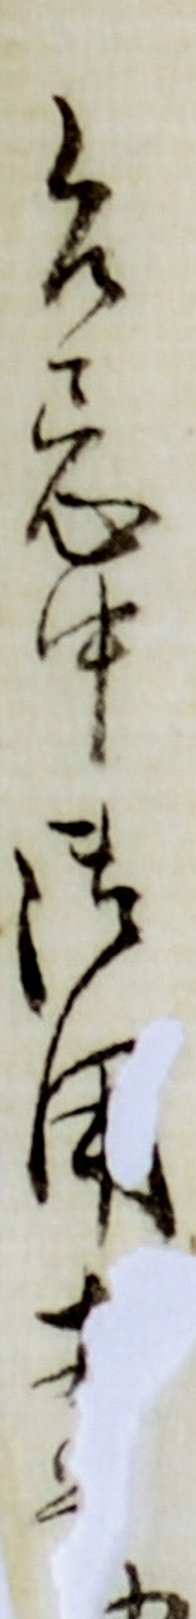乍忌中御用相勤度
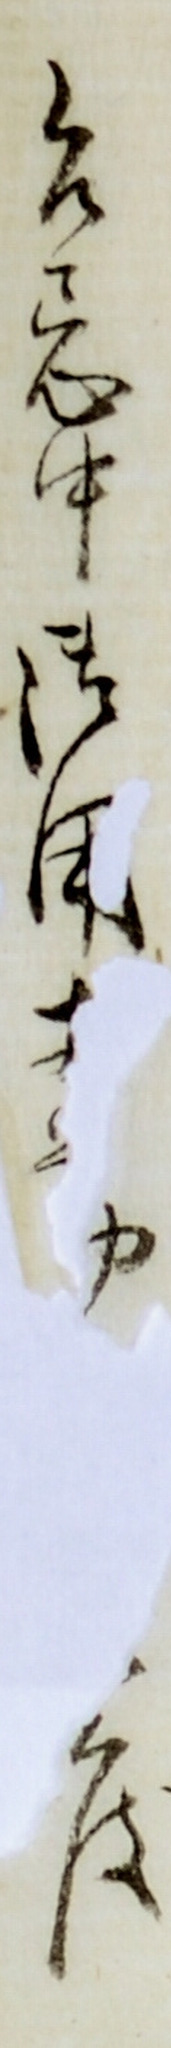乍忌中御用相勤度

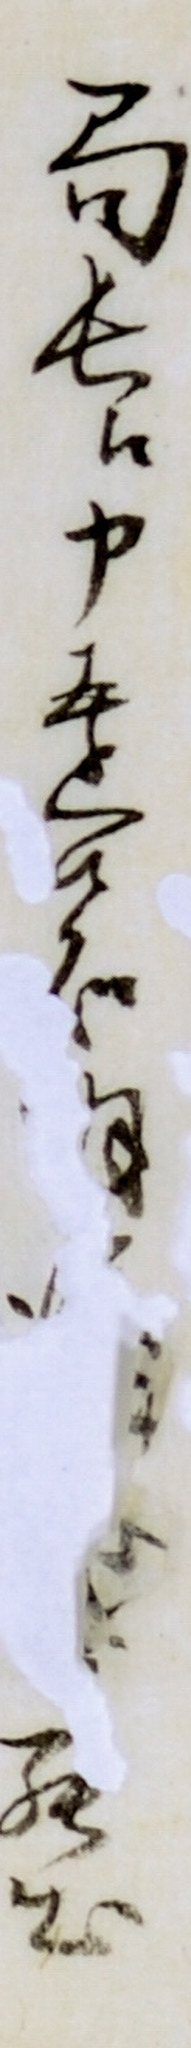局長え申達候処明罷出
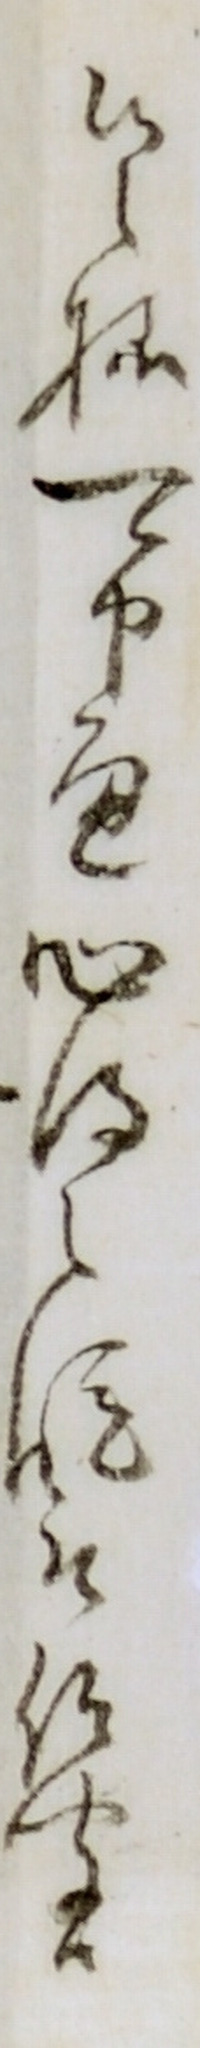候之様可申通心得之段被仰聞候
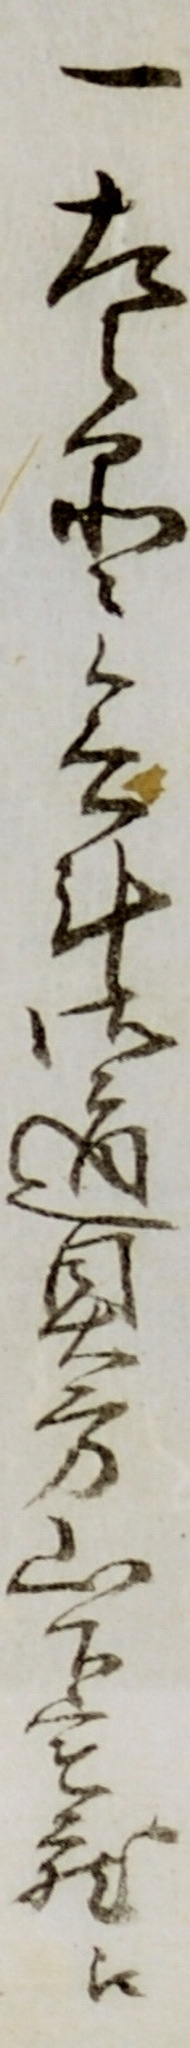一左之品々会計御道具方山下宅蔵え
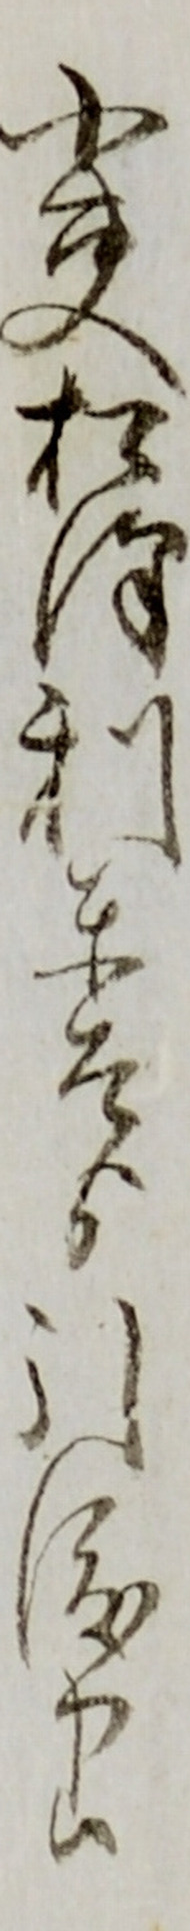小吏松沢利東太ゟ引渡申候
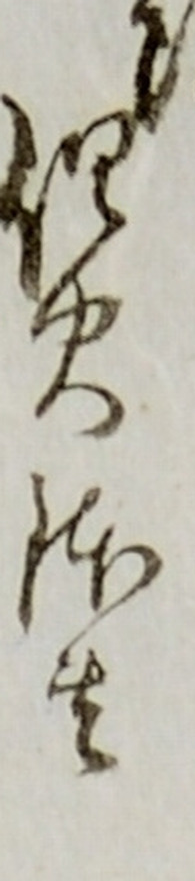但火鉢共
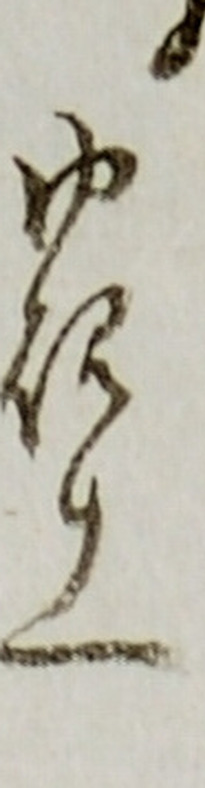内硯十一
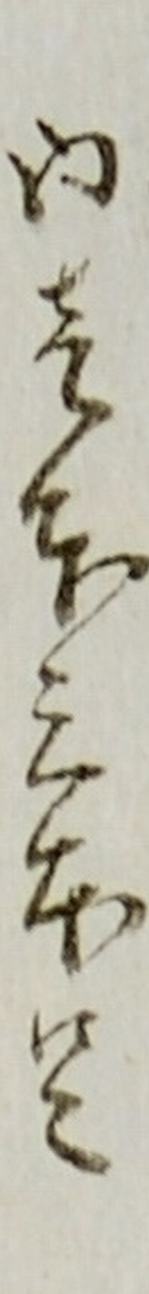内壱本三本足
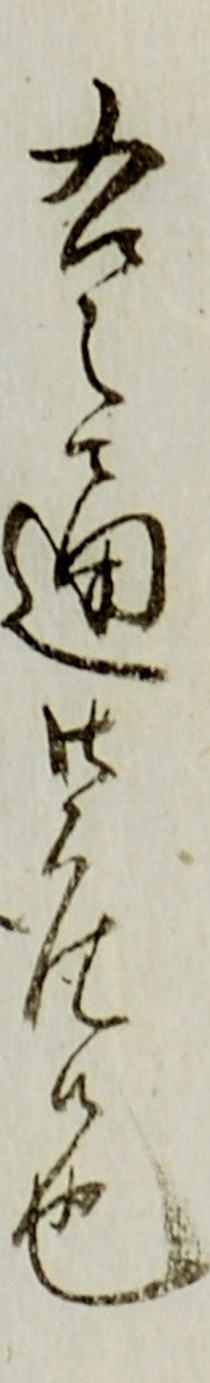右之通御座候也
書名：山林方諸事御用留
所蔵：伊那市立高遠町図書館・合同会社AMANE
